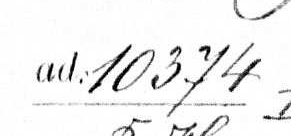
ad. 10374
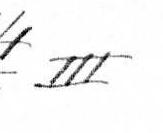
III
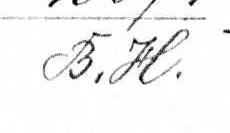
B. H.
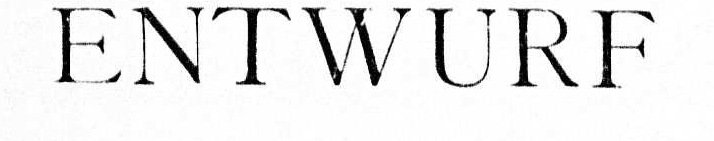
Entwurf
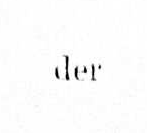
der
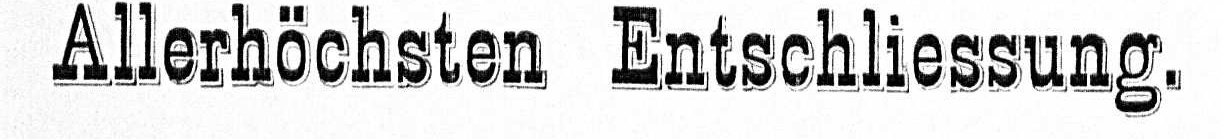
Allerhöchsten Entschliessung.
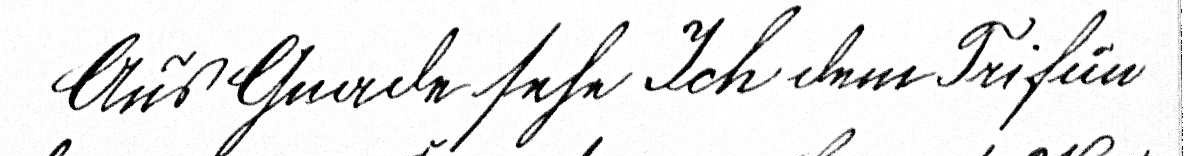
Aus Gnade sehe Jch dem Trifun
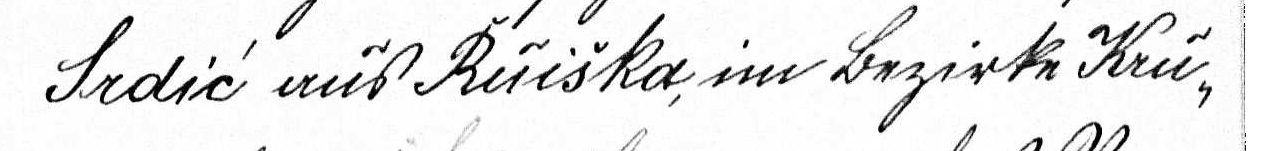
Srdić und Ruiška, im Bezirke Kru¬
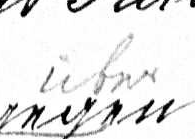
über
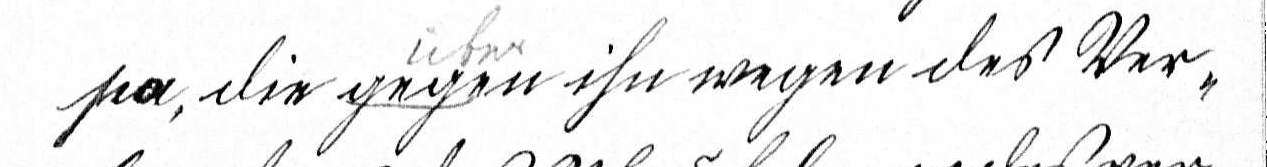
pa, die ihn wegen des Ver¬
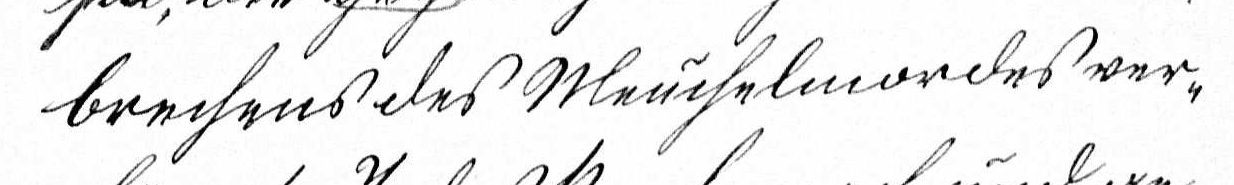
brechens des Meuchelmordes ver¬
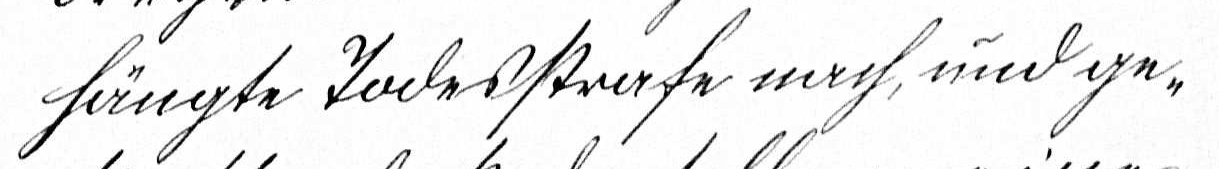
hängte Todesstrafe nach, und ge¬
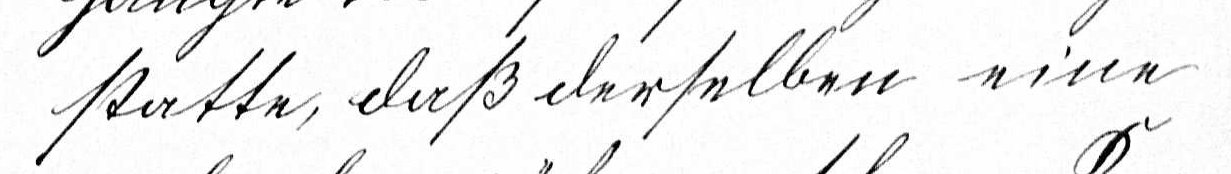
statte, daß derselben eine
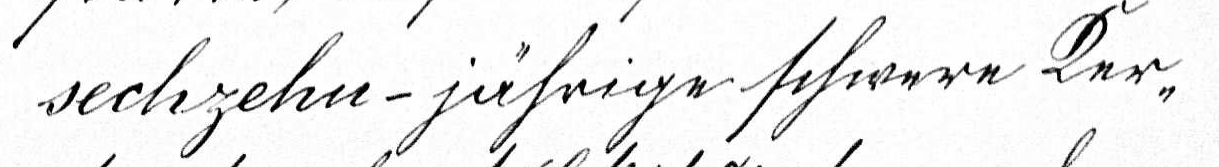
sechzehn-jährige schwere Ker¬
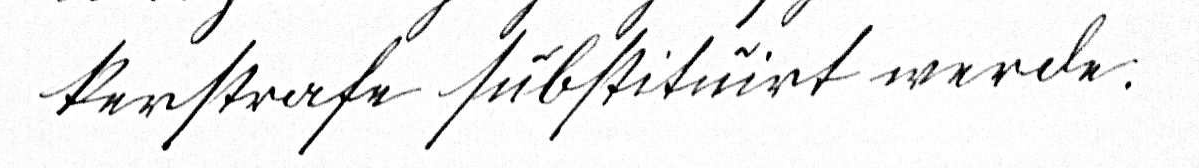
kerstrafe substituirt werde.
